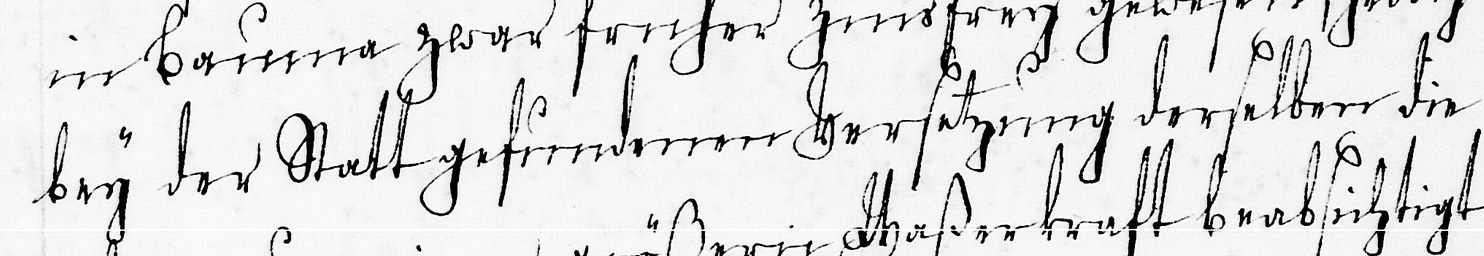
bey der Statt gefundenen Versetzung derselben die
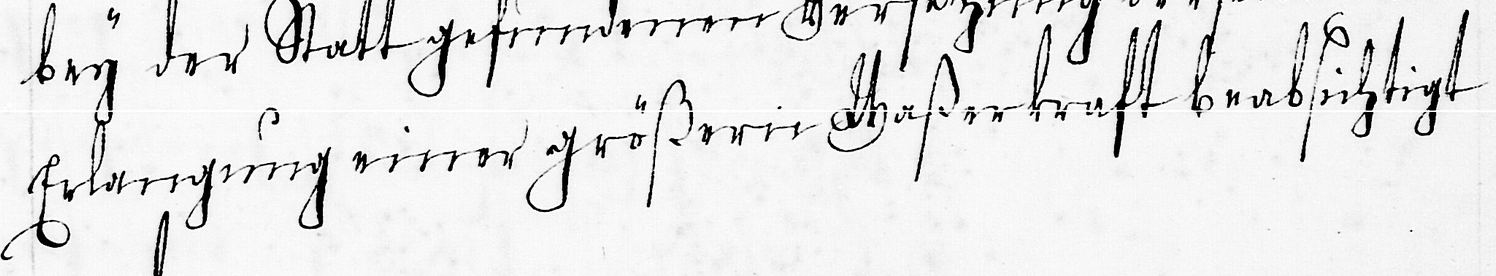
Erlangung einer größern Waßerkraft beabsichtigt
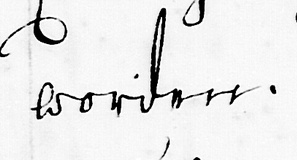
worden.
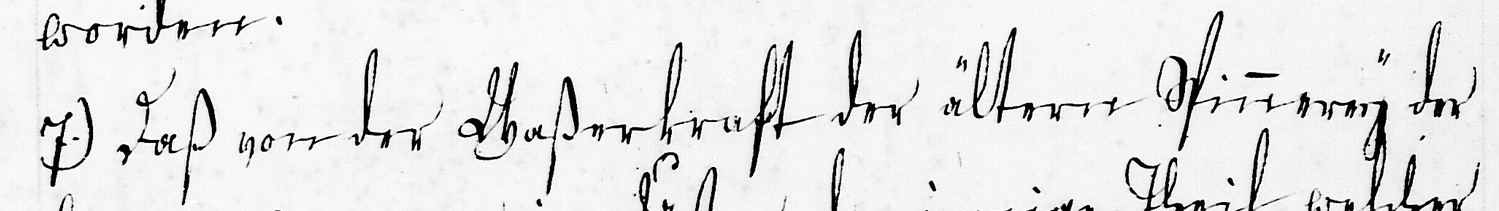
7.) Daß von der Waßerkraft der ältern Spinnerey der
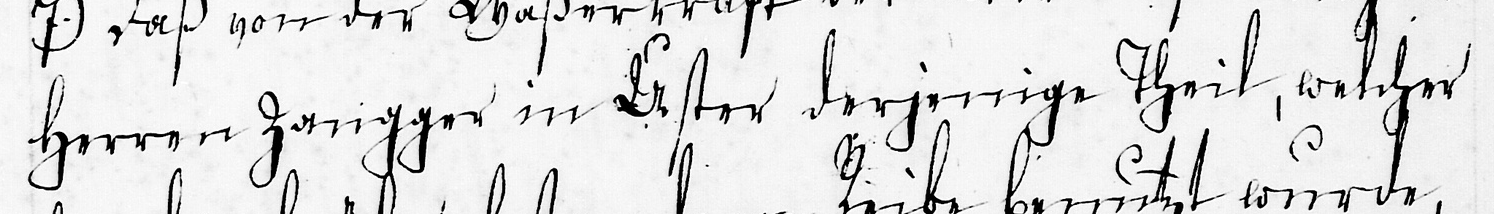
Herren Zangger in Uster derjenige Theil, welcher
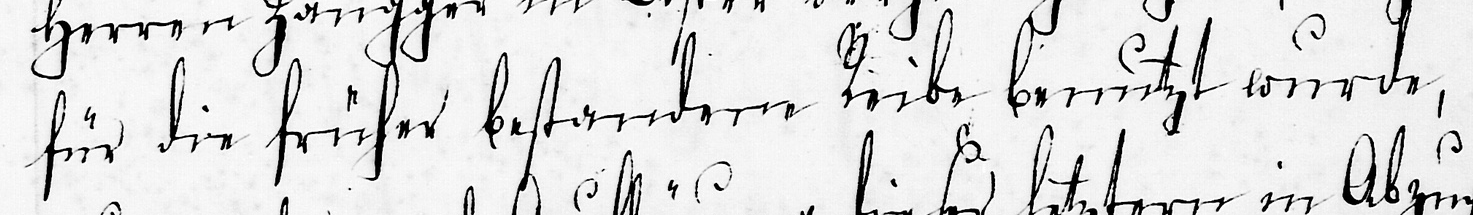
für die früher bestandene Reibe benutzt wurde,
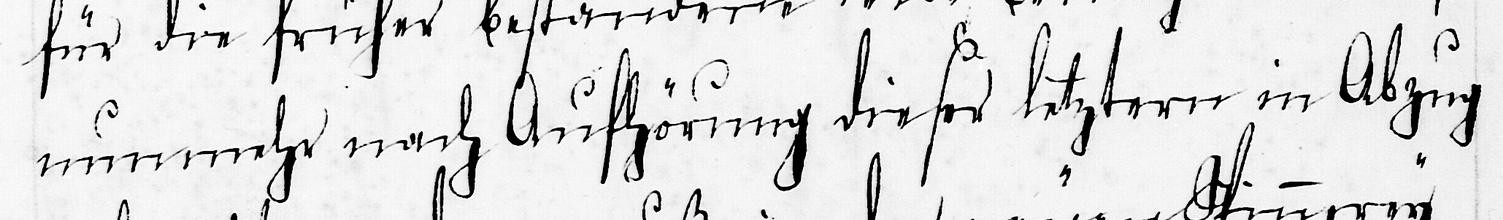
nunmehr nach Aufhörung dieser letztern in Abzug
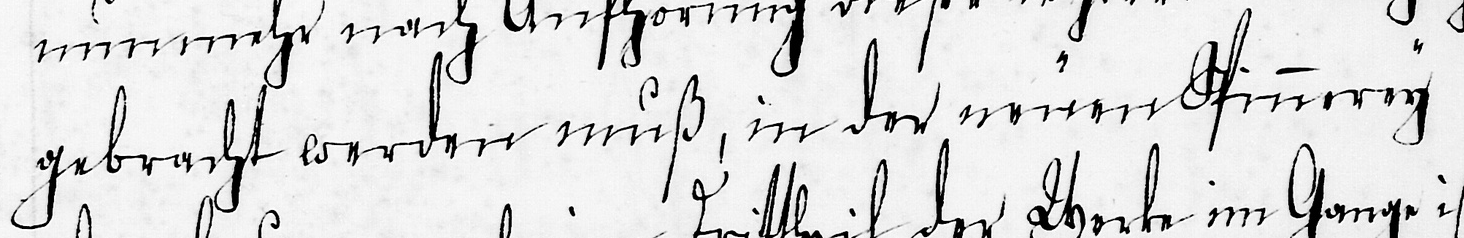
gebracht werden muß, in der neuen Spinnerey
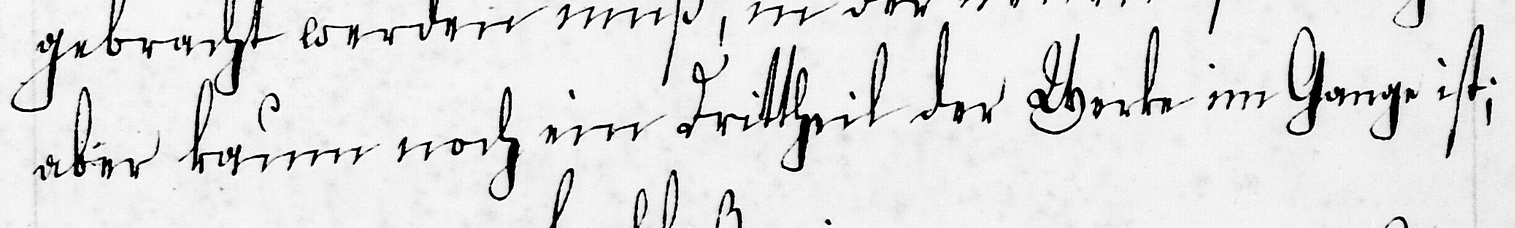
aber kaum noch ein Drittheil der Werke im Gange ist;
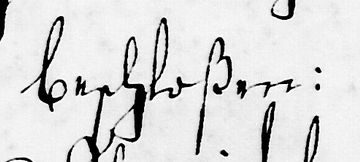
beschloßen:
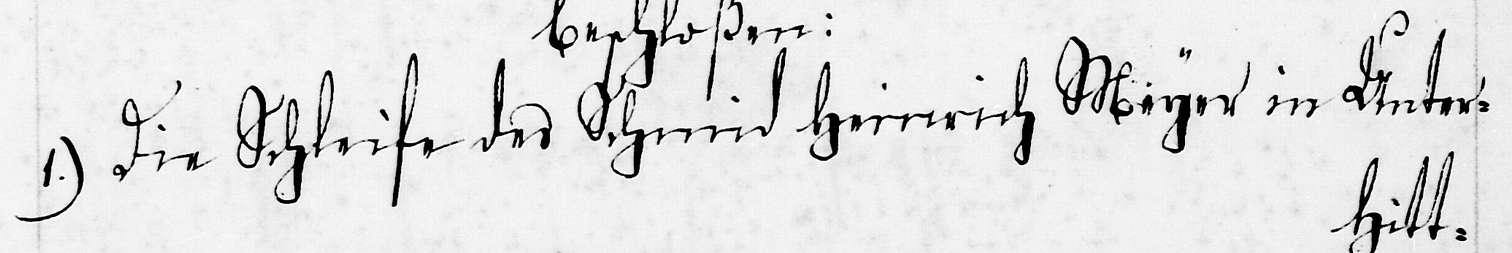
1.) Die Schleife des Schmid Heinrich Meyer in Unter-
